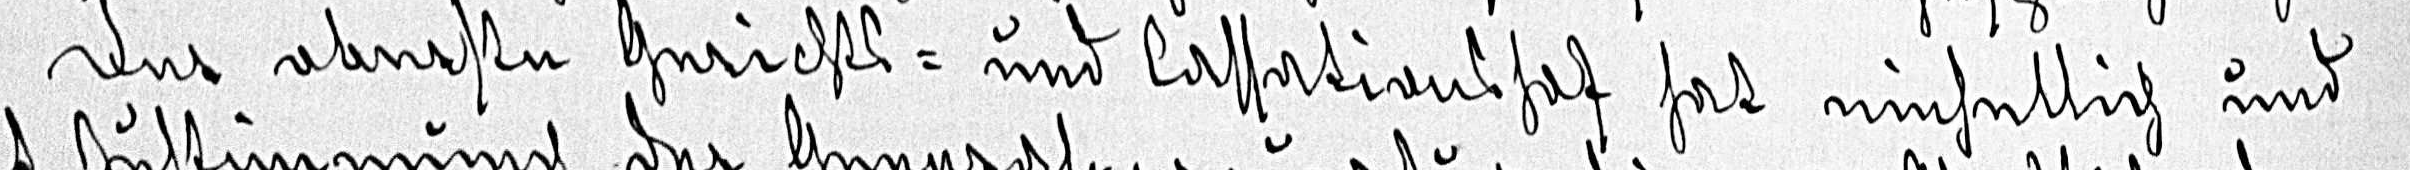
Der oberste Gerichts- und Cassationshof hat einhellig und
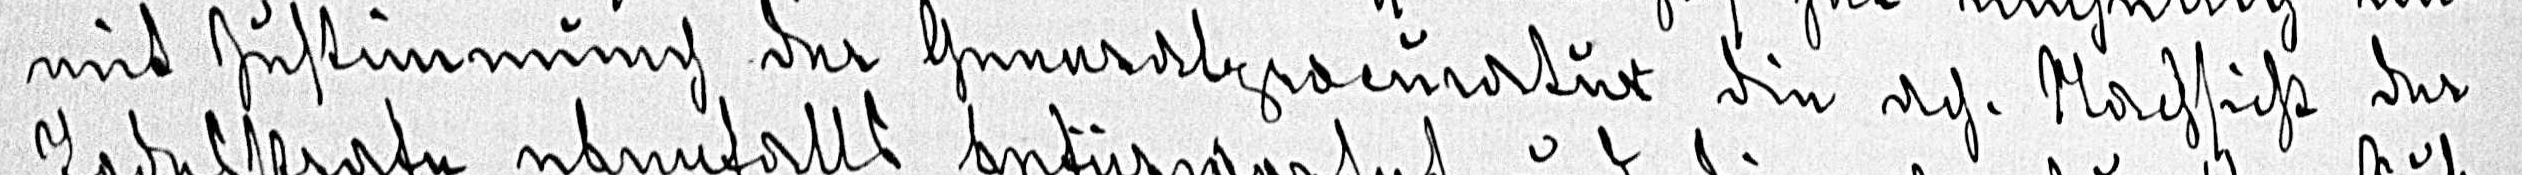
mit Zustimmung der Generalprocuratur die ag. Nachsicht der
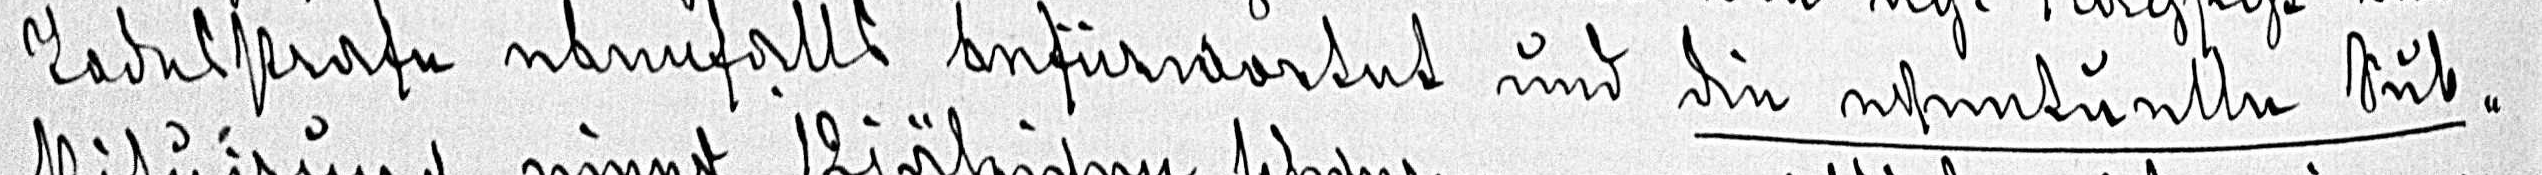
Todesstrafe ebenfalls befürwortet und die eventuelle Sub¬
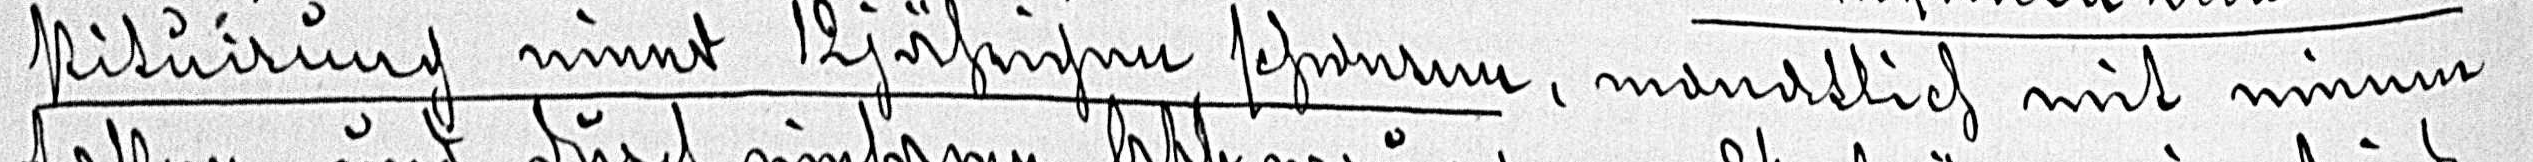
stituirung einer 12jährigen schweren, monatlich mit einem
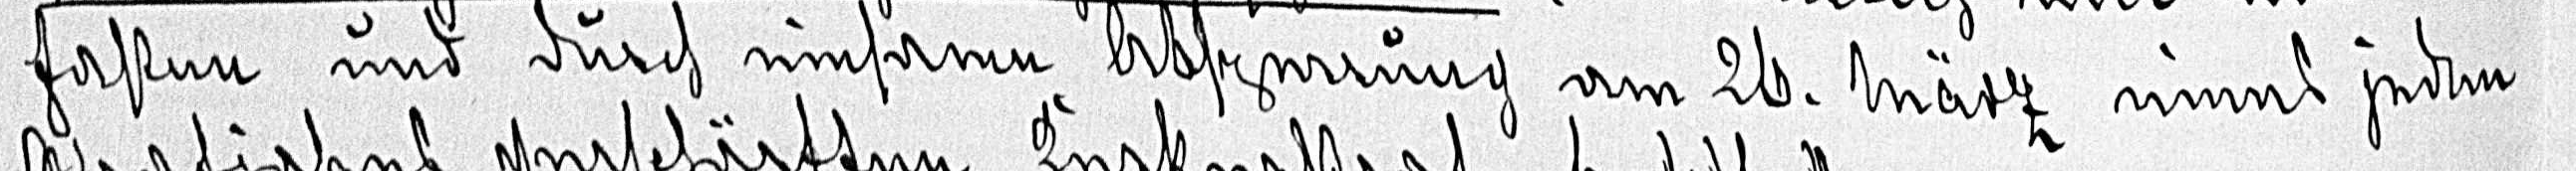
Fasten und durch einsame Absperrung am 26. März eines jeden
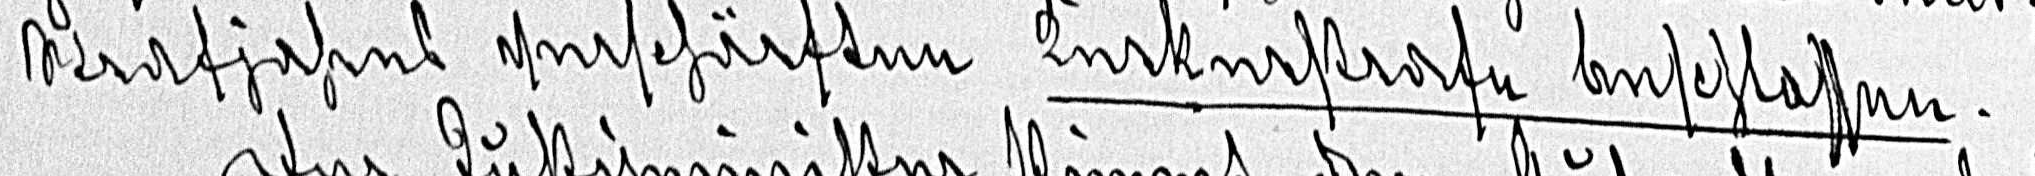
Strafjahres verschärften Kerkerstrafe beschlossen.
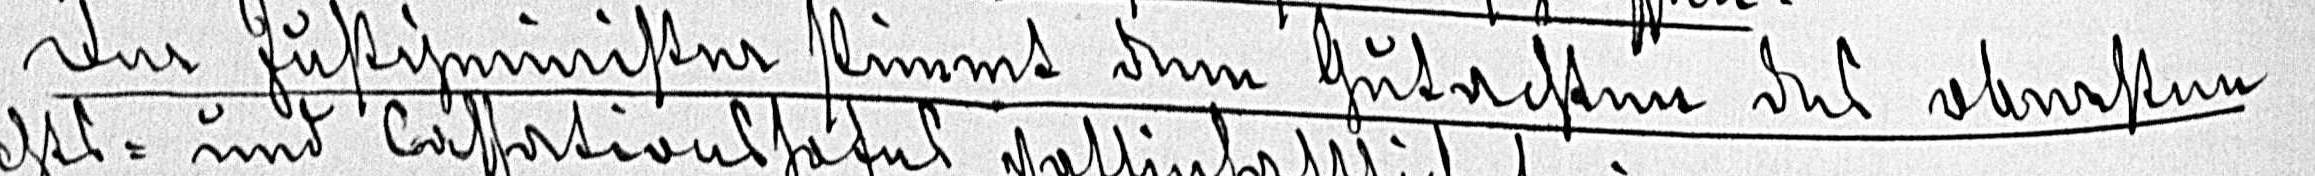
Der Justizminister stimmt dem Gutachten des obersten
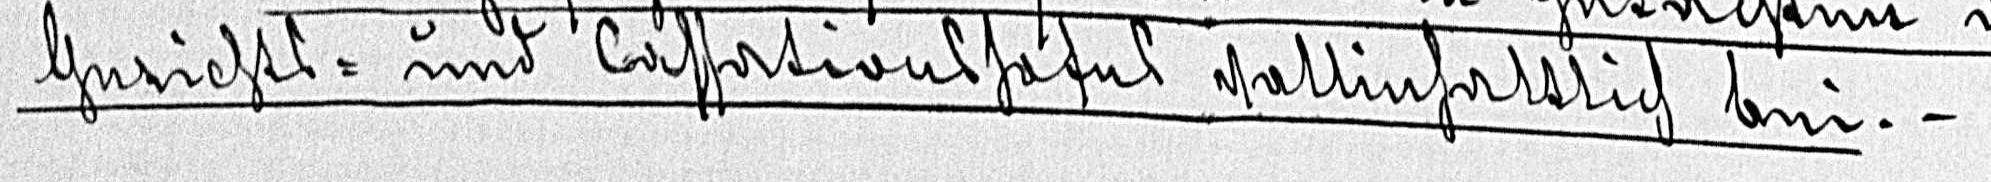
Gerichts- und Cassationshofes vollinhaltlich bei.
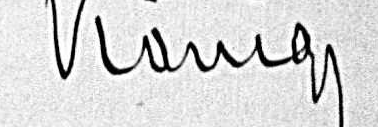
König
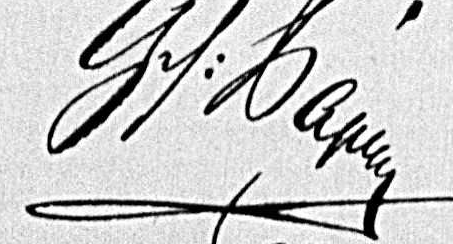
Ges. Papay
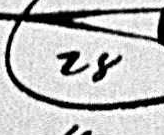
28/
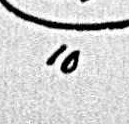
10
